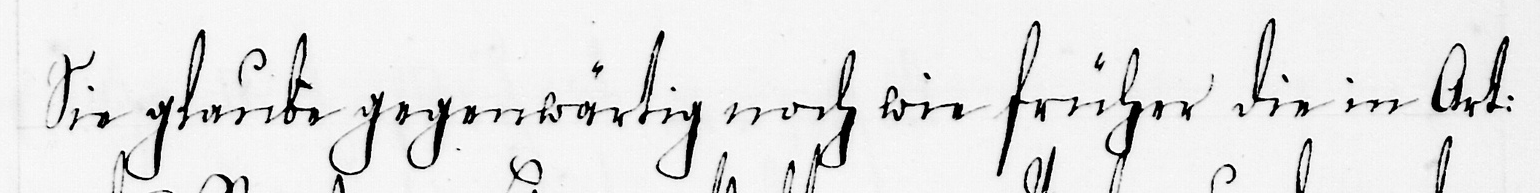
Sie glaube gegenwärtig noch wie früher die in Art:
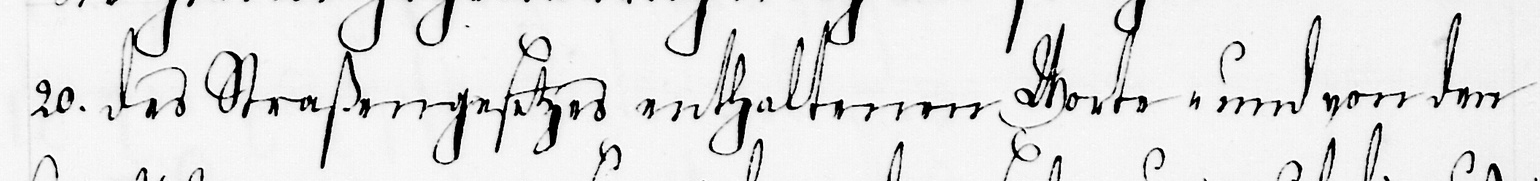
20. des Straßengesetzes enthaltenen Worte „und von den
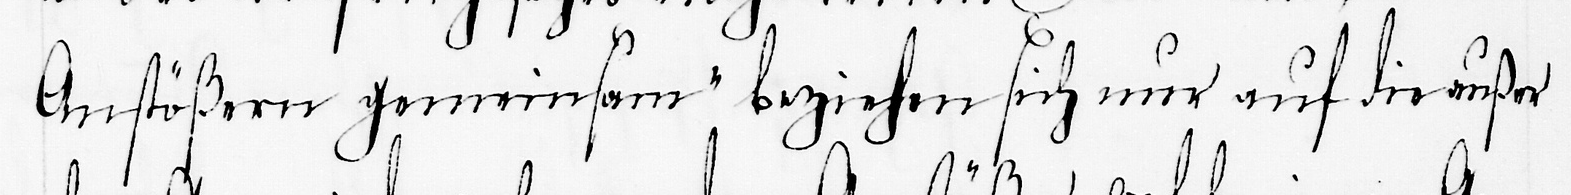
Anstößern gemeinsam“ beziehen sich nur auf die außer
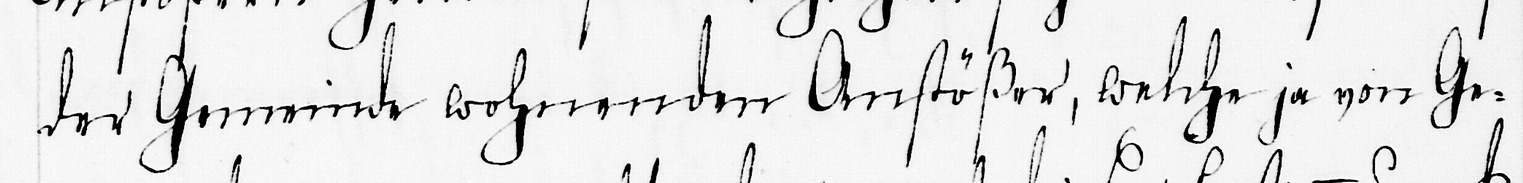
der Gemeinde wohnenden Anstößer, welche ja von Ge¬
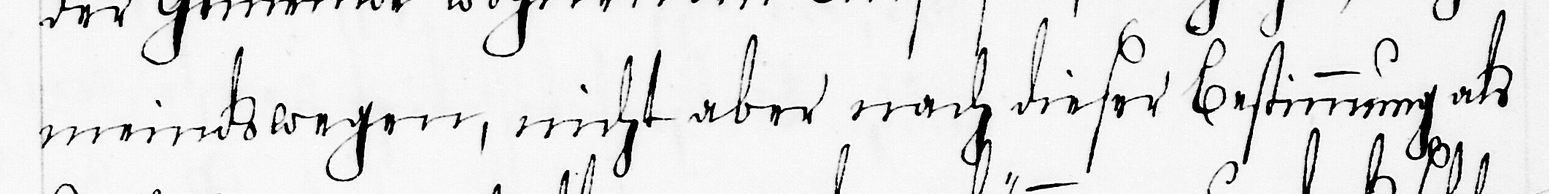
meindswegen, nicht aber nach dieser Bestimmung als
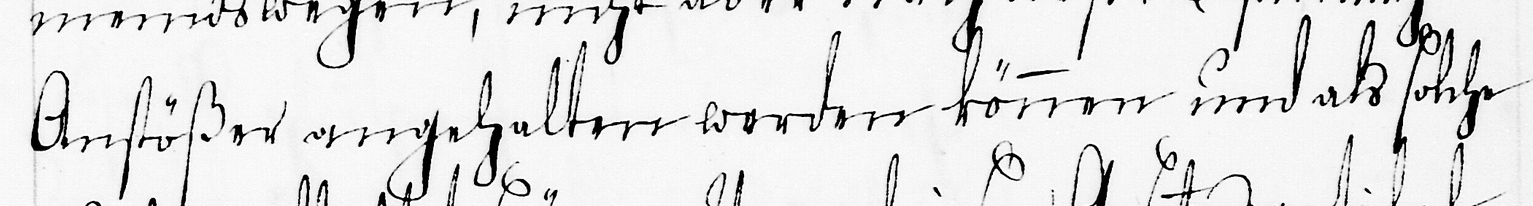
Anstößer angehalten werden können und als solche
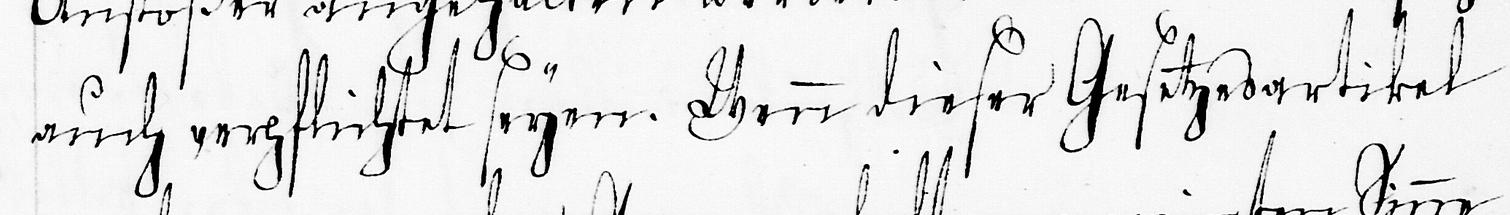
auch verpflichtet seyen. Wenn dieser Gesetzesartikel
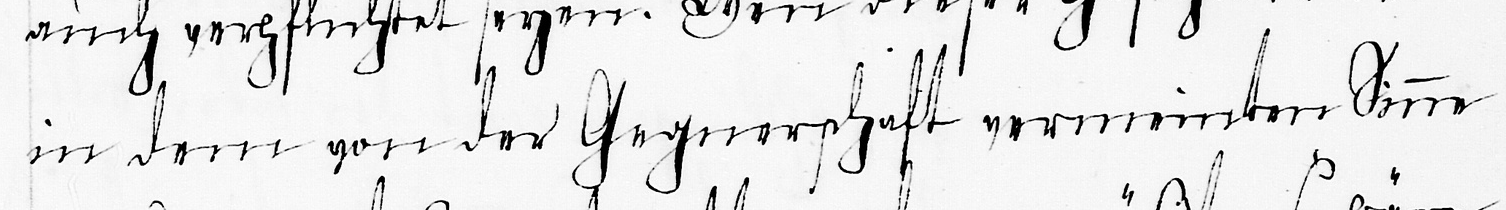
in dem von der Gegnerschaft vermeinten Sinne
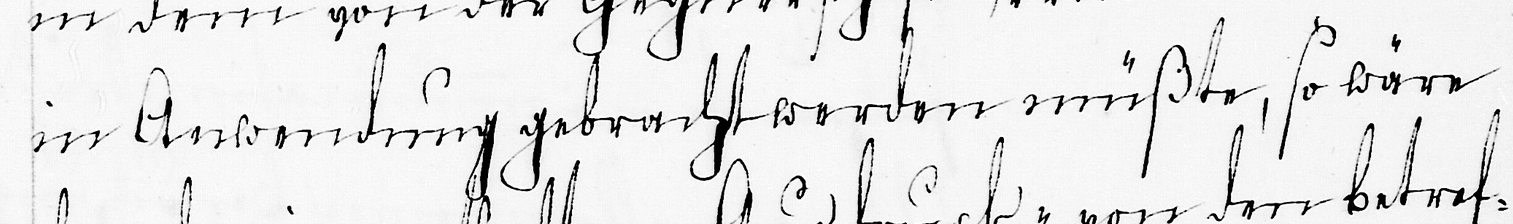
in Anwendung gebracht werden müßte, so wäre
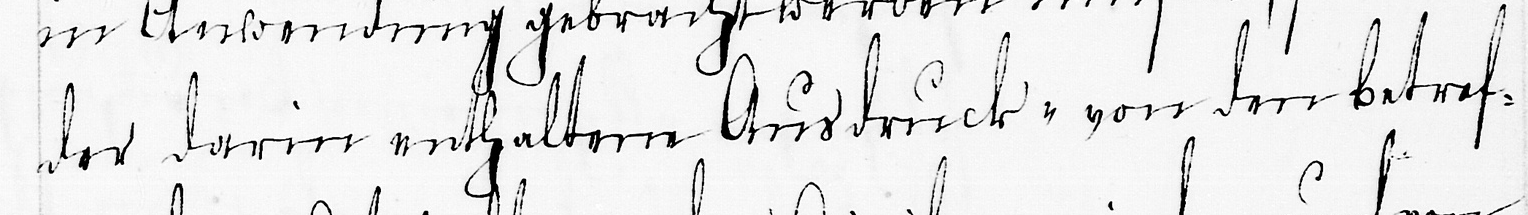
der darin enthaltene Ausdruck „von den betref¬
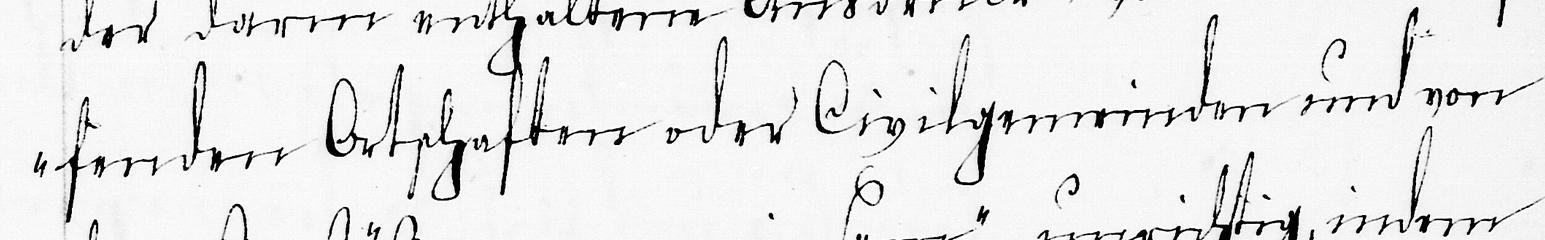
fenden Ortschaften oder Civilgemeinden und von
